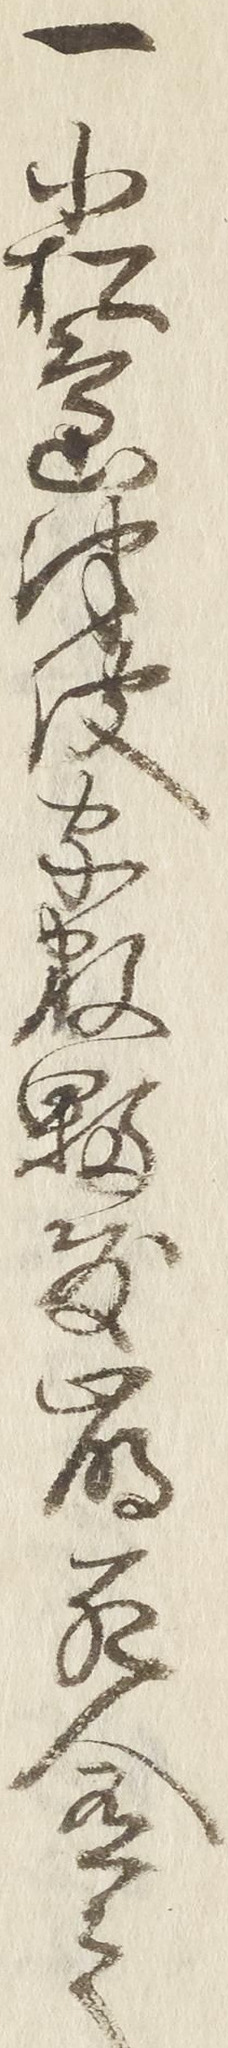一小松島津波家数夥敷崩死人有之
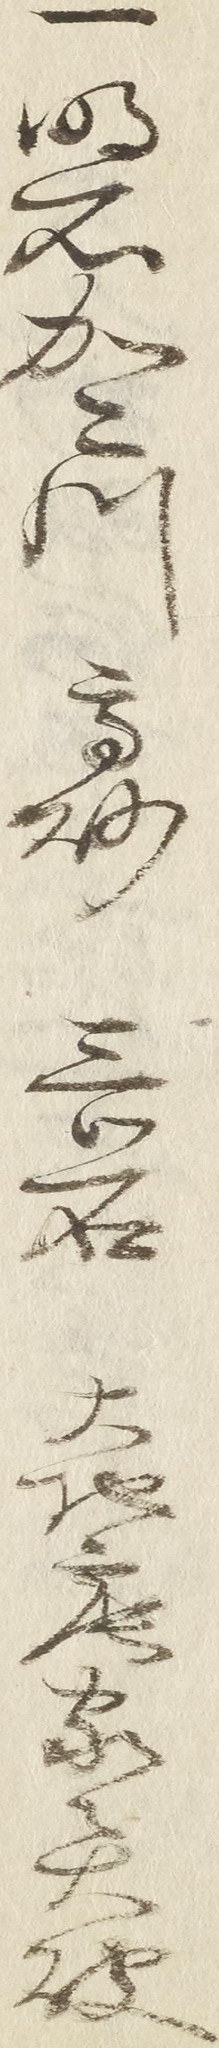一明石かこ川高砂三ッ石大地震家々大破
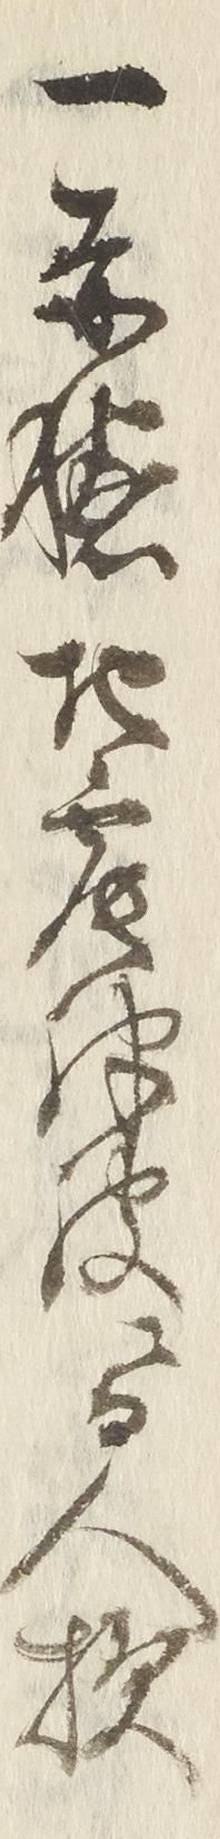一赤穂地震津波二而人損
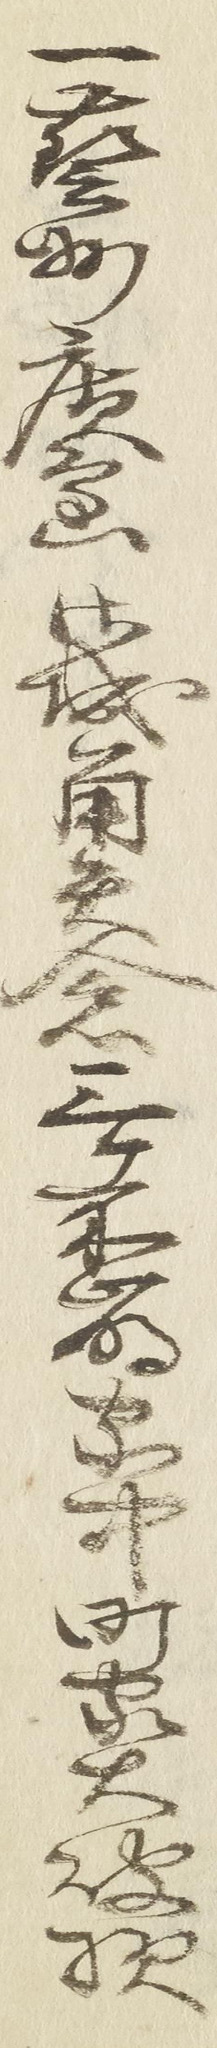一芸洲広島御城角矢倉三ヶ所崩家中町家大破損
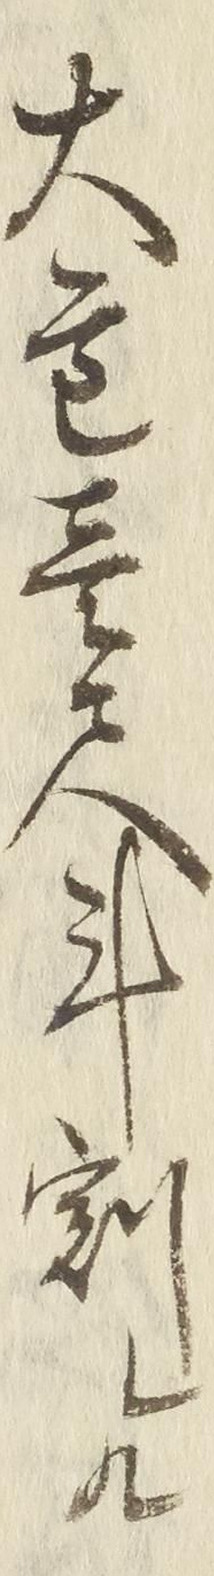大道壱尺斗割ㇾㇽ

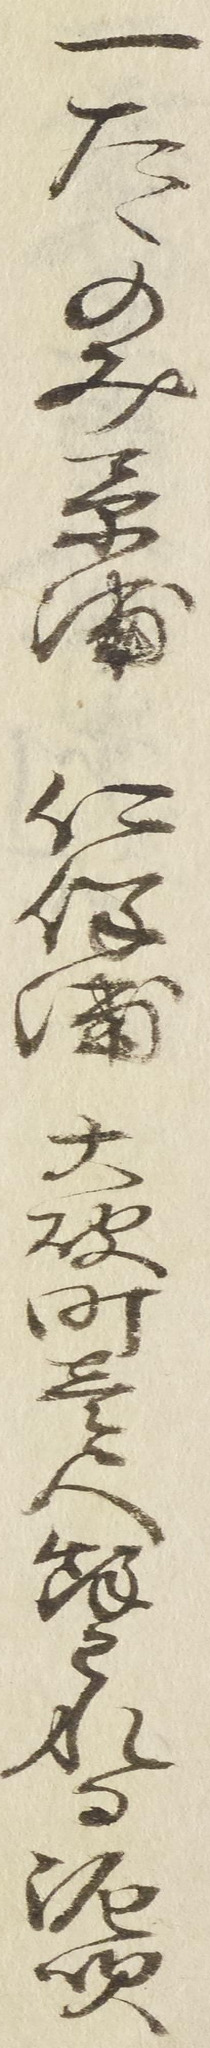一たゝのみ柔浦仁保浦大破町壱尺餘われる泥吹
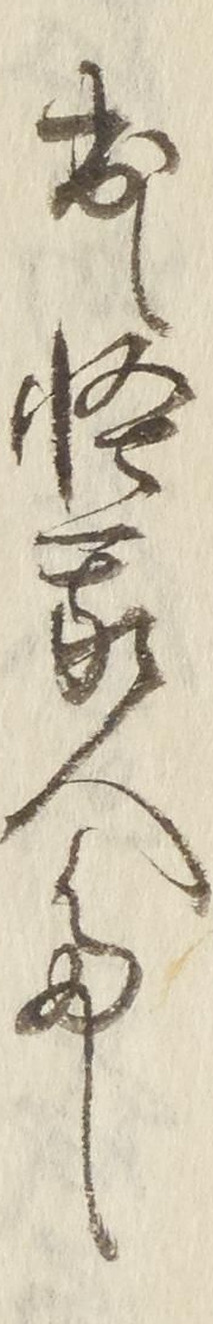出し怪我人多し
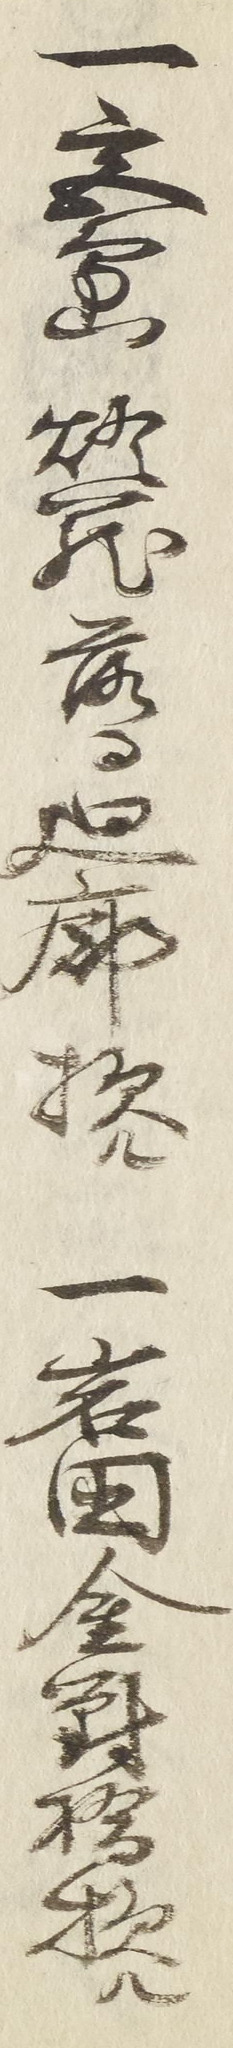一宮島燈籠落る廻廊損ㇽ一岩国金対橋損ㇽ
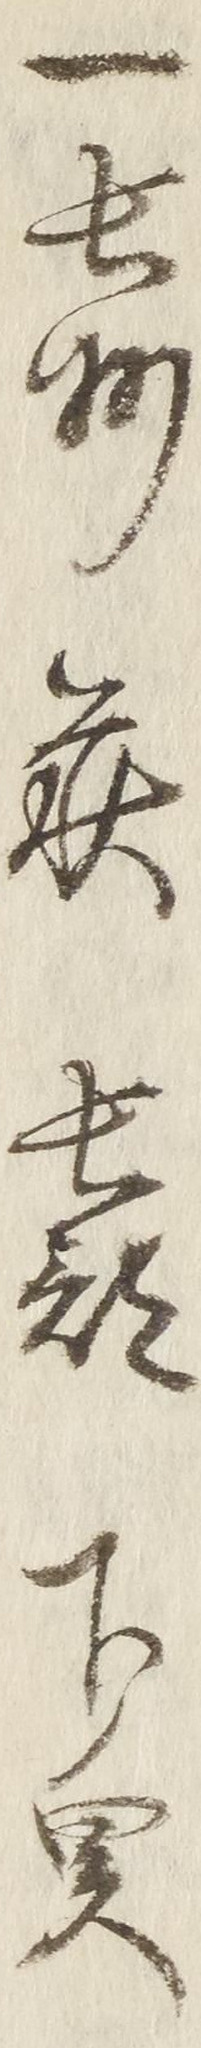一長州萩長都下ノ関
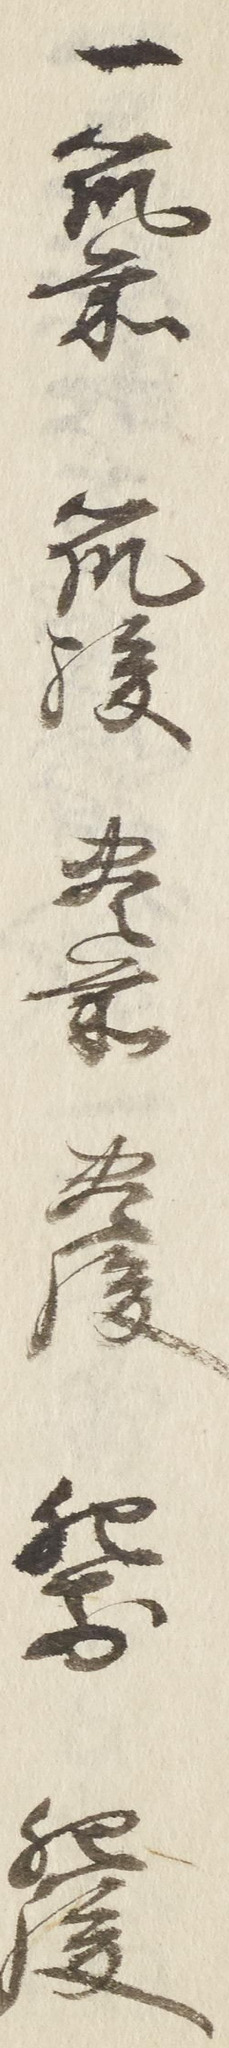一筑前筑後豊前豊後肥前肥後
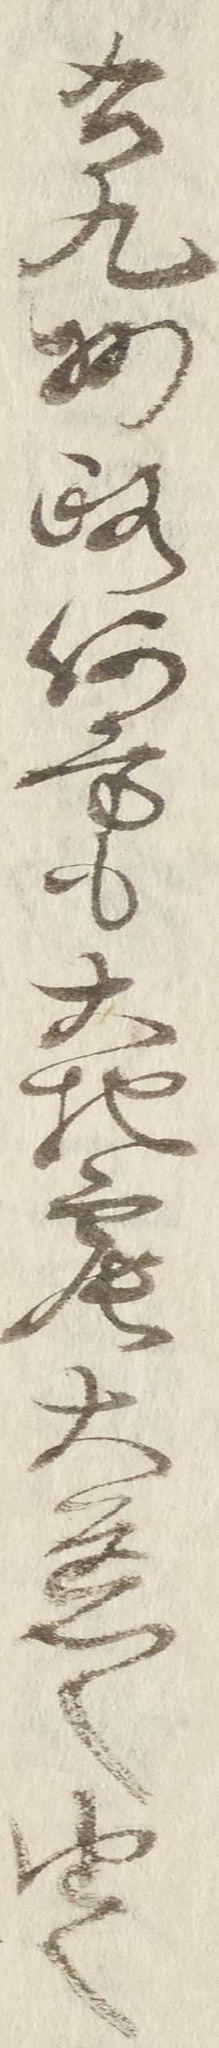右九州路何方も大地震大荒之由也
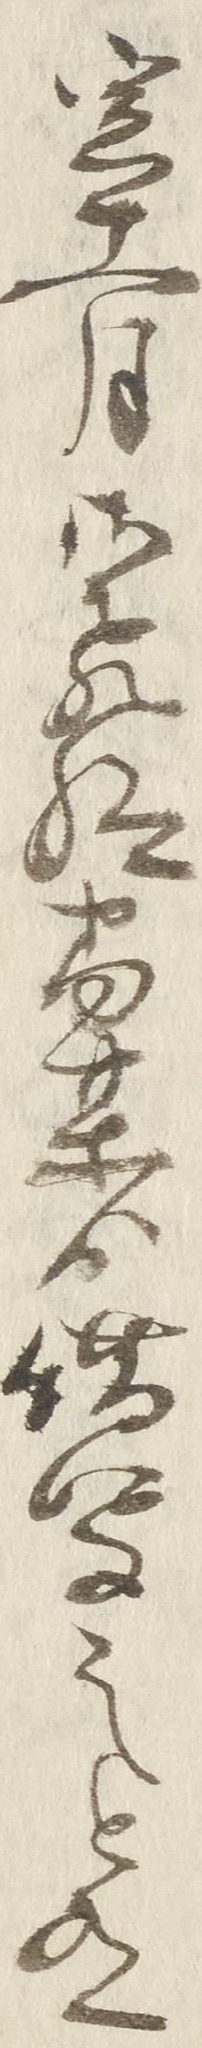寅十一月御飛脚番某ゟ借写之候以上
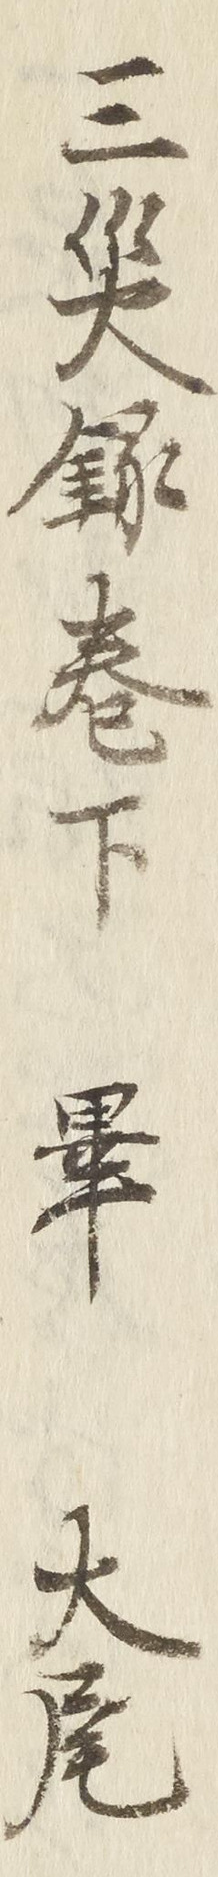三災録巻下畢大尾
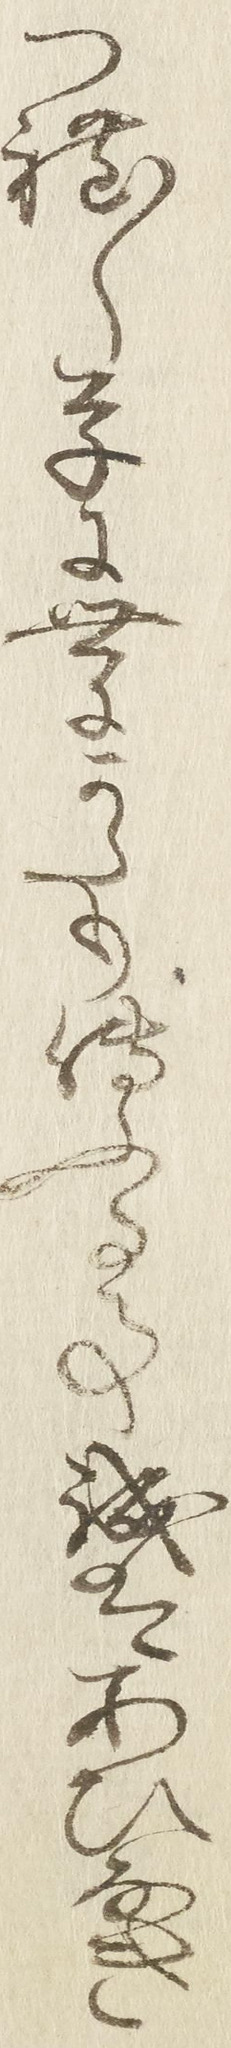つね〳〵筆に世にかたも伝ふる事誠はあひなき
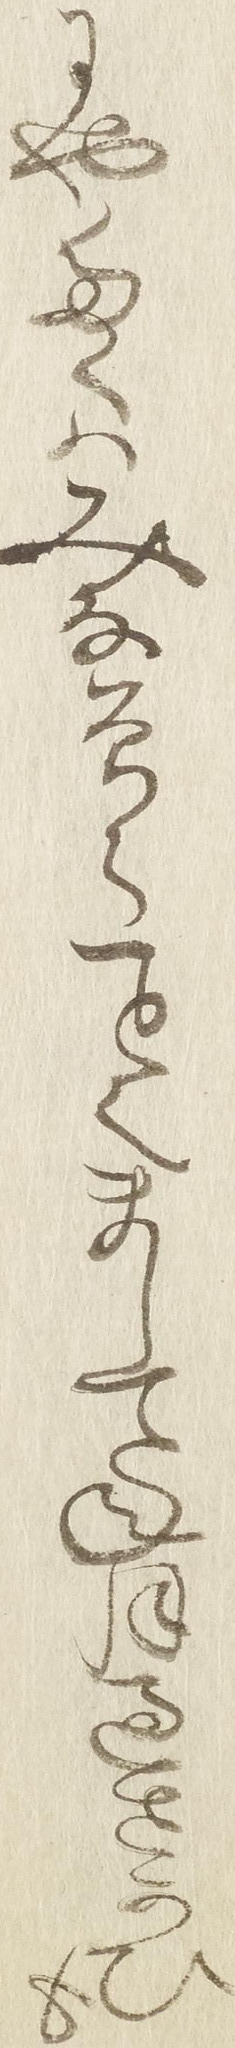にや多くはみなそらこと也まして年月過さかひも
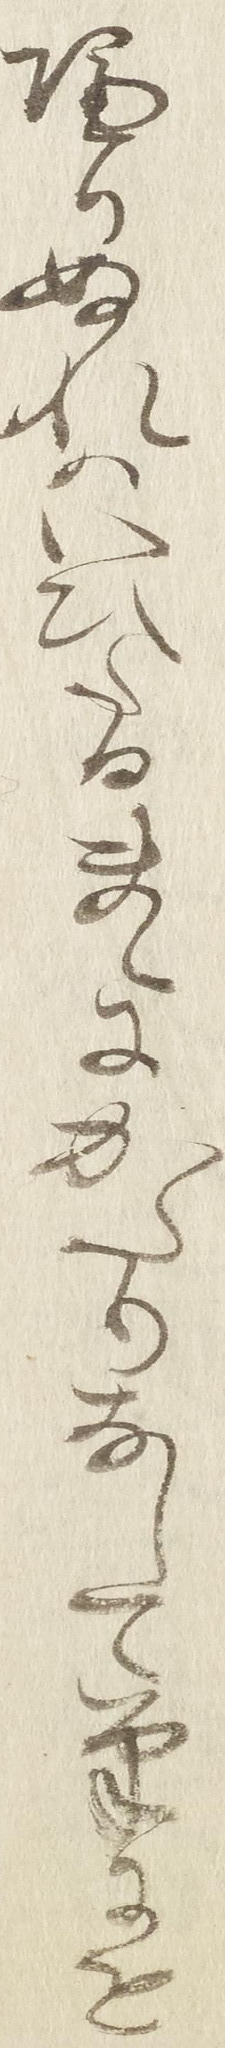隔りぬれはいひたるまゝにかたりなして筆にと
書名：地震記　下
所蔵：東京大学地震研究所図書室 Earthquake Research Institute Library, The University of Tokyo, JAPAN
